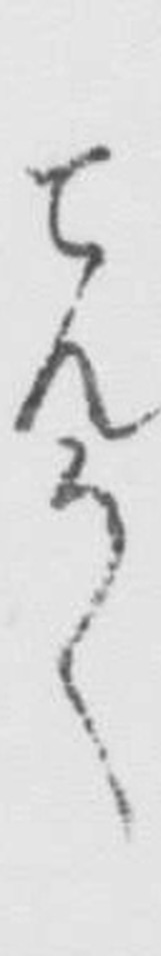てんかく
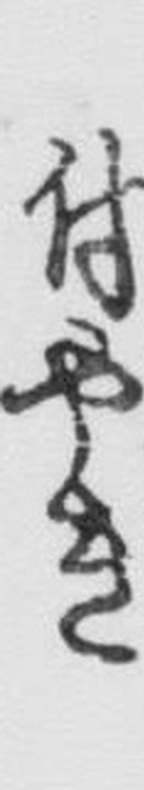付やき
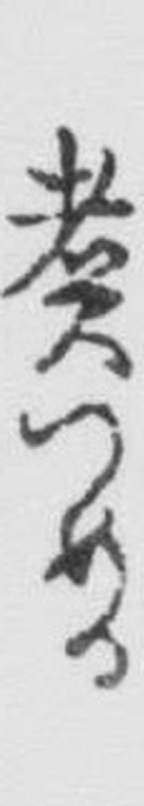煮つめる
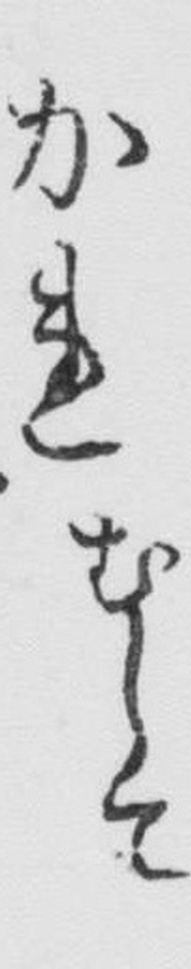かれむして
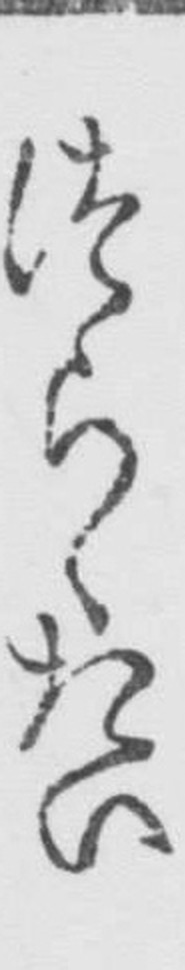つらゝたい
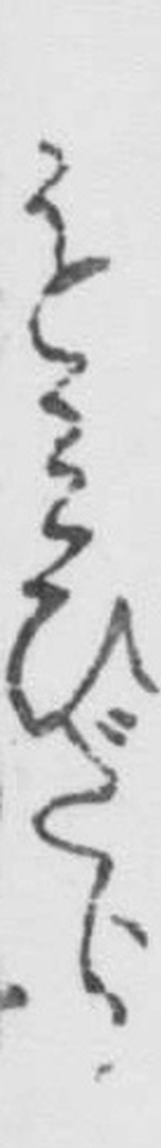近みひだら
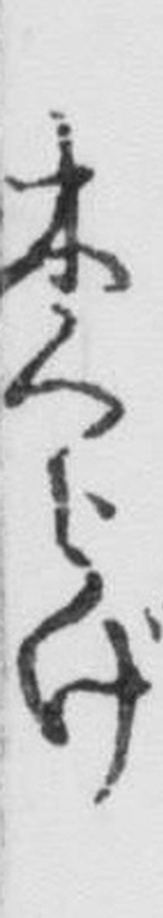木くらげ
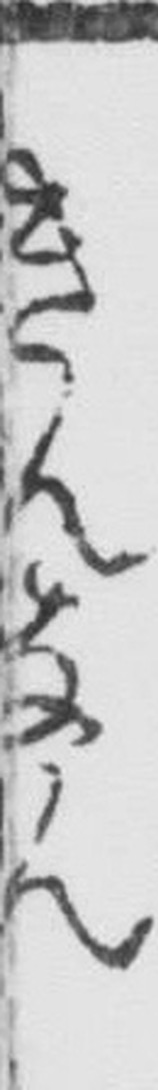きんなん

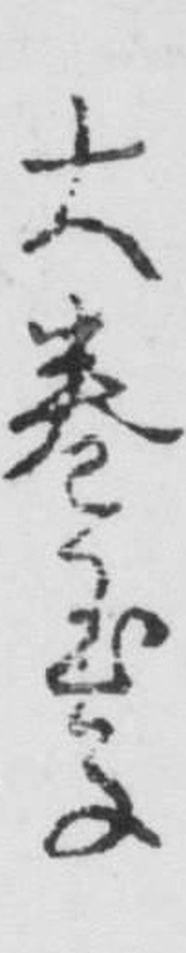大巻玉子
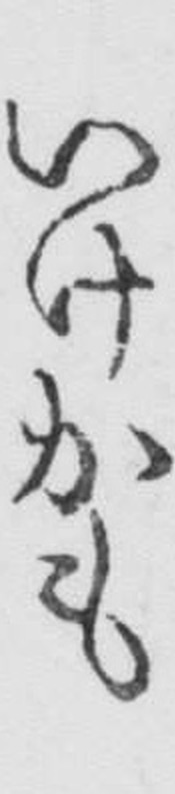いけかも
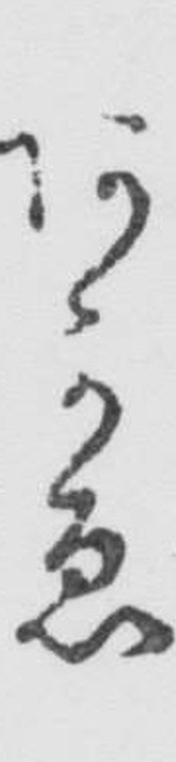あかゑ
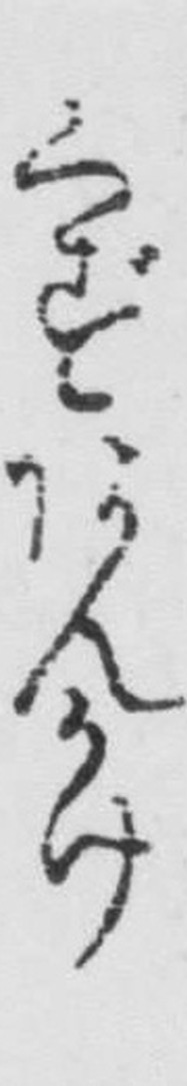くずあんかけ
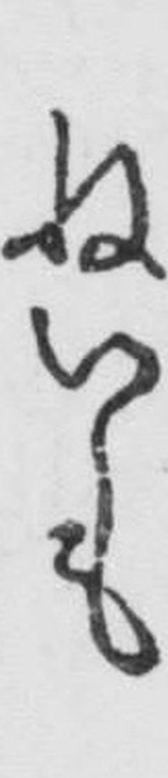ねいも
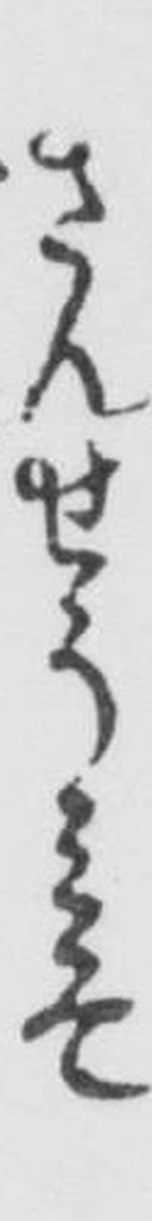さんせうみそ
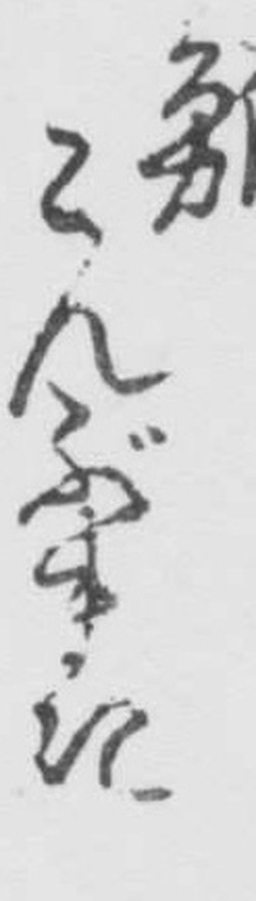こんぶまき
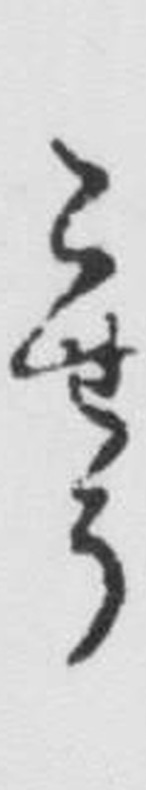こせう
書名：諸家通用/即席料理
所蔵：大阪府立大学学術情報センター 国文学研究資料館
